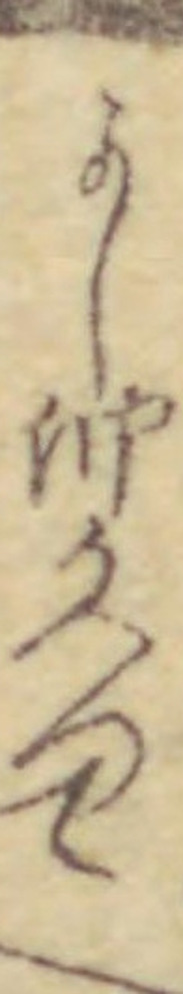よし仲かへつて
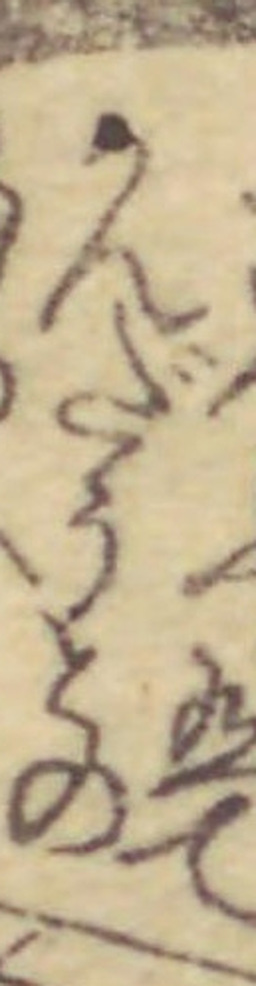かんだうとの
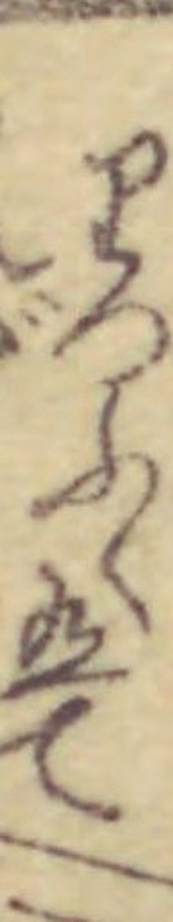りつふく有て
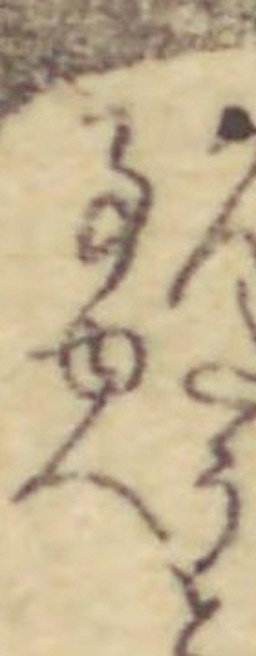事ゆへ
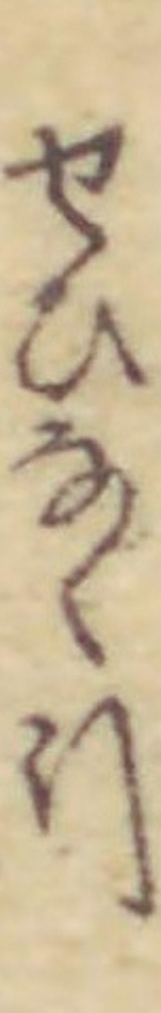せひなく引
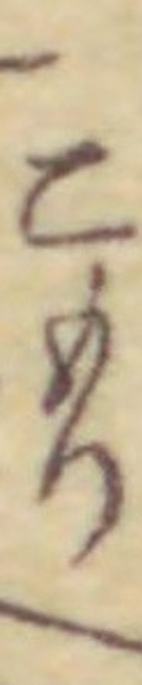こもり
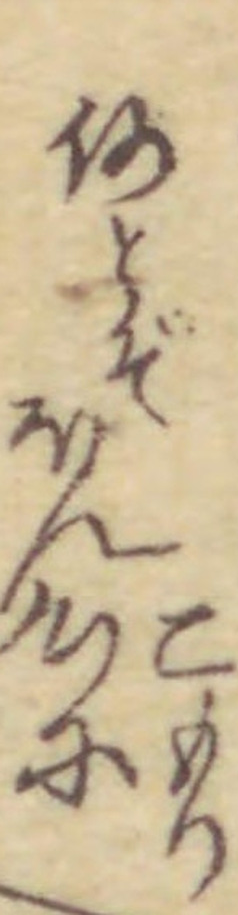何とぞほん心に
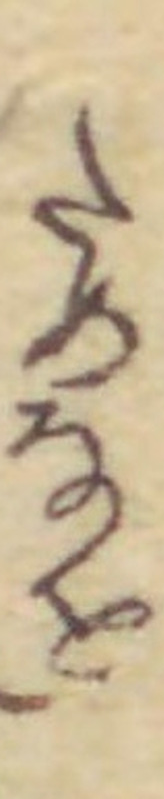ためなを
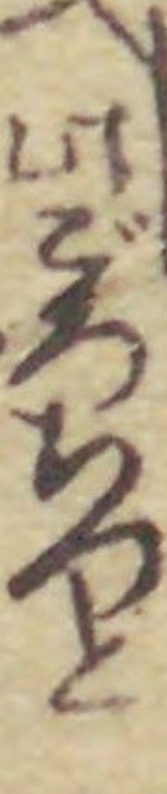此ごろちつと
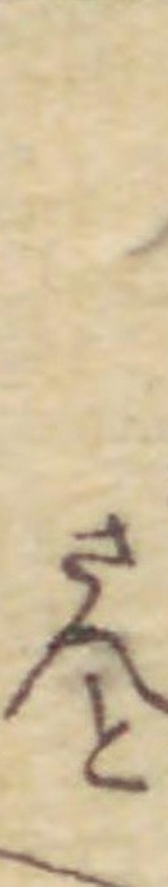さんと
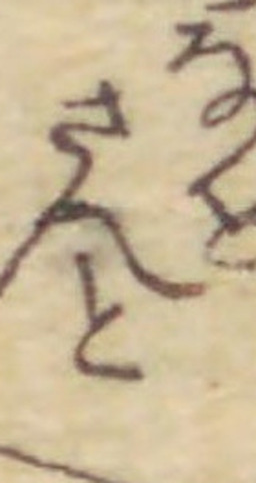さんと
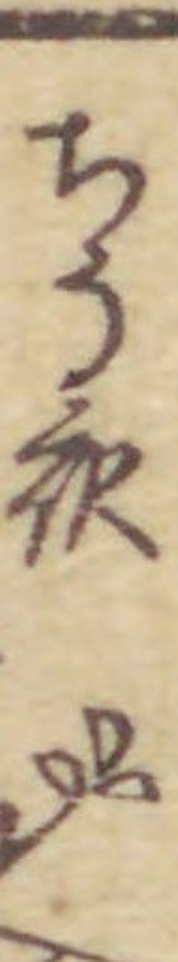ちう夜
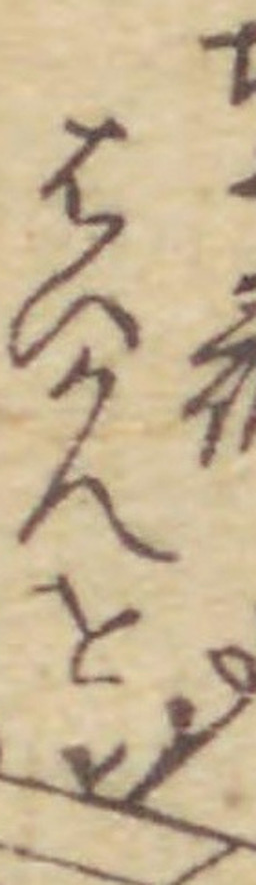はいかんを
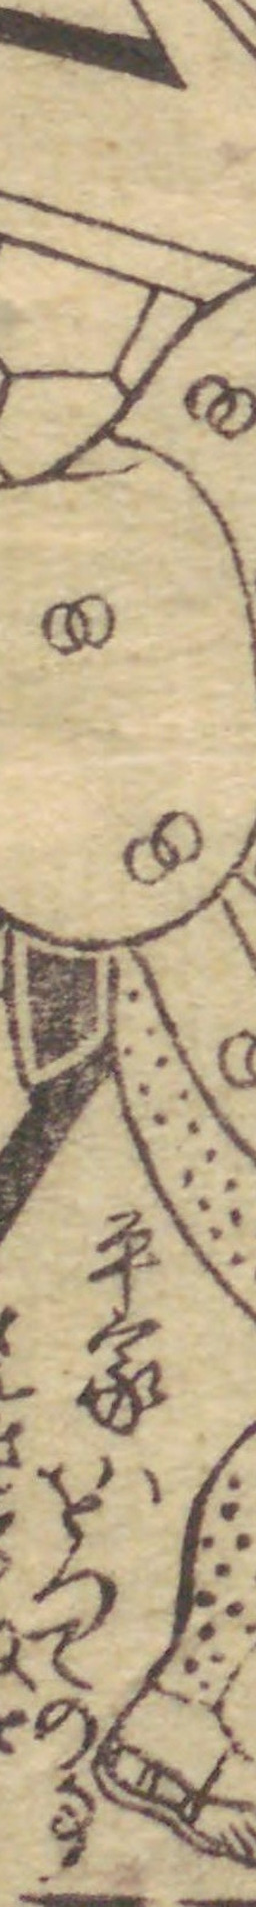平家はをつての事
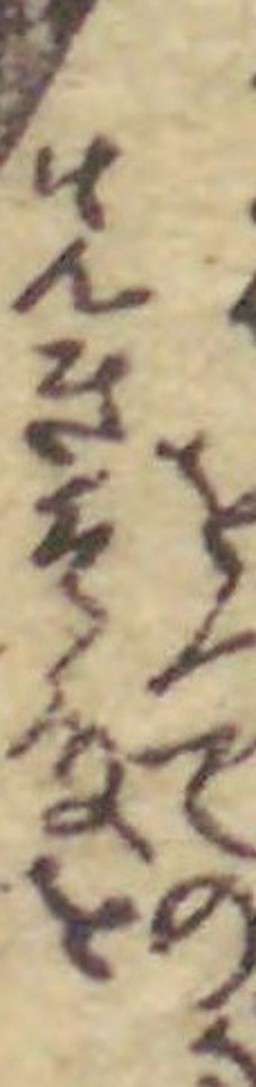先きそ殿を
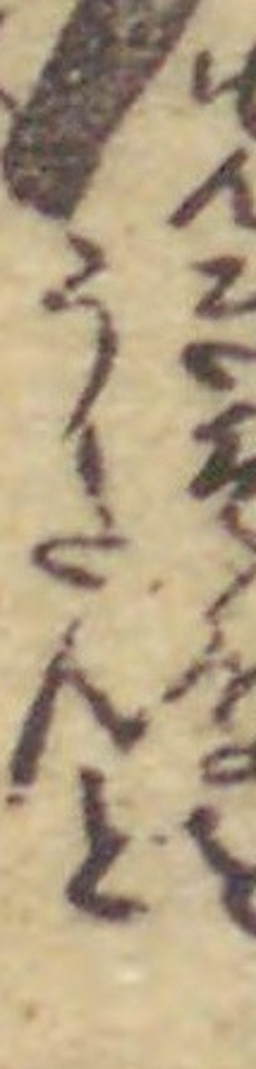うたんと
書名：朝比奈草摺実記 2巻
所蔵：国立国会図書館 National Diet Library, JAPAN
